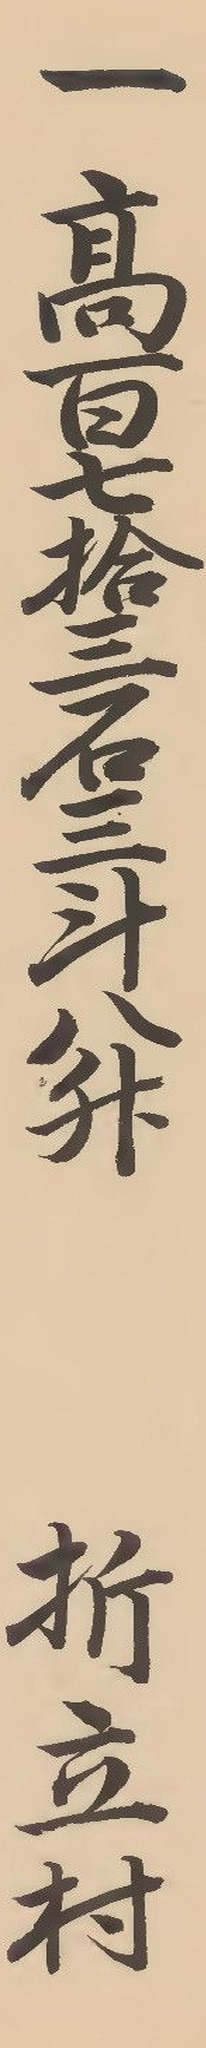一高百七拾三石三斗八升折立村
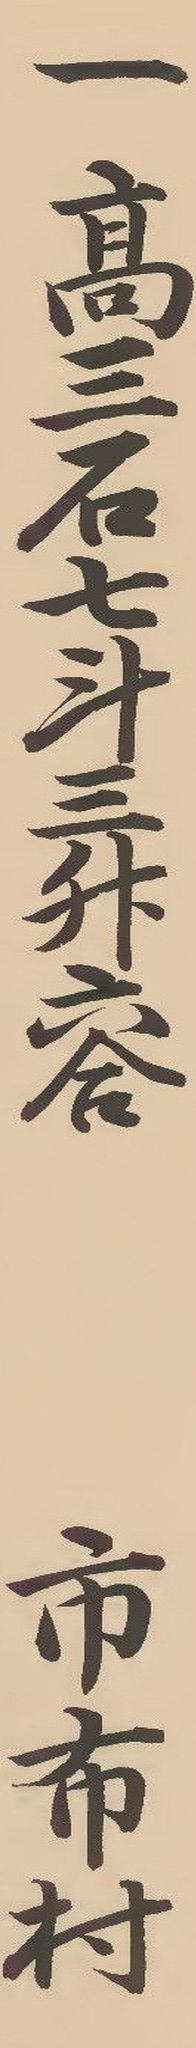一高三石七斗三升六合市布村
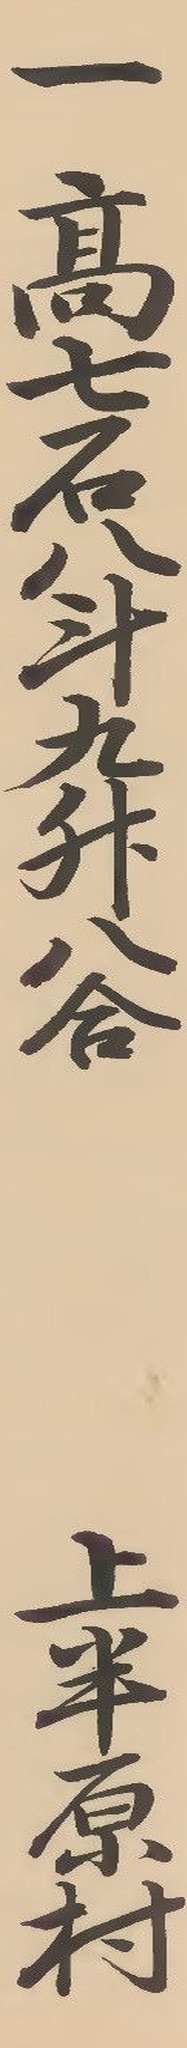一高七石八斗九升八合上半原村
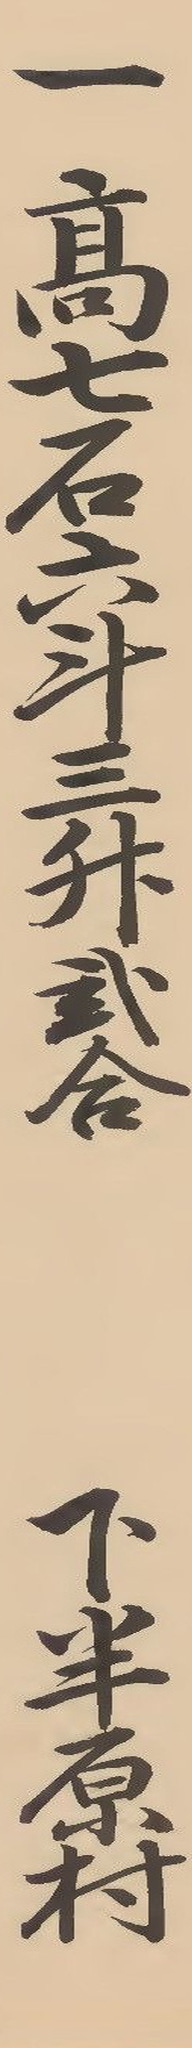一高七石六斗三升弐合下半原村
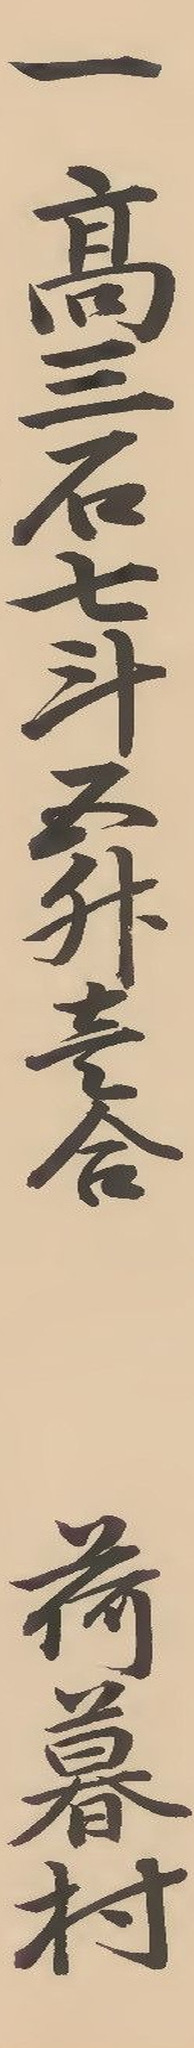一高三石七斗五升壱合荷暮村

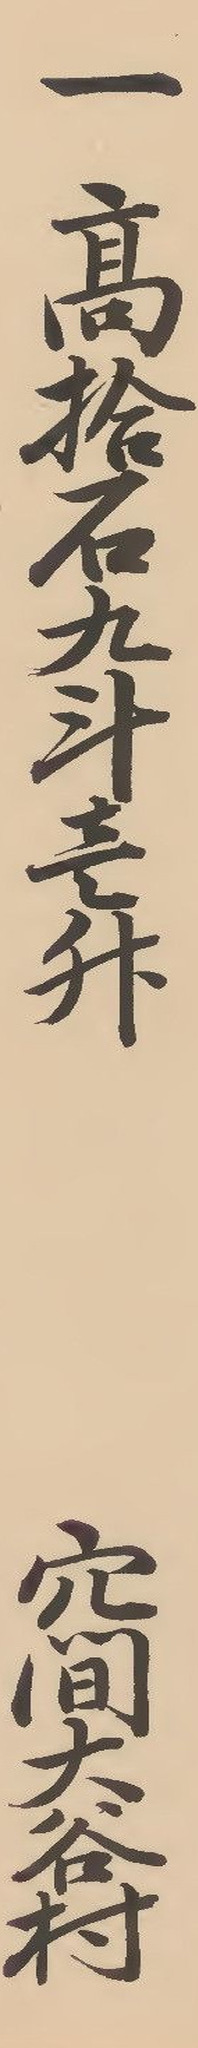一高拾石九斗壱升穴間大谷村
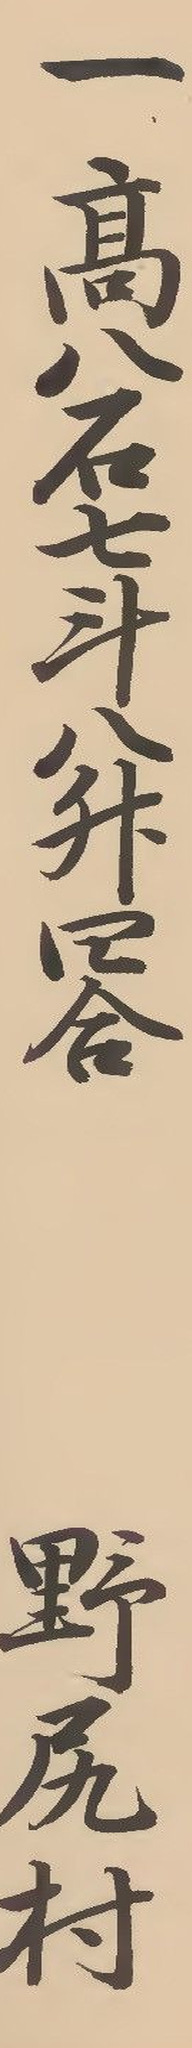一高八石七斗八升四合野尻村
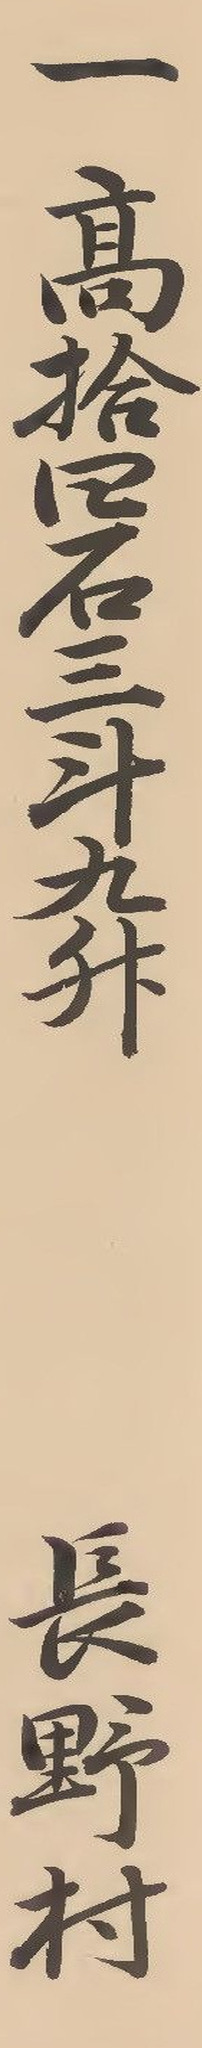一高拾四石三斗九升長野村
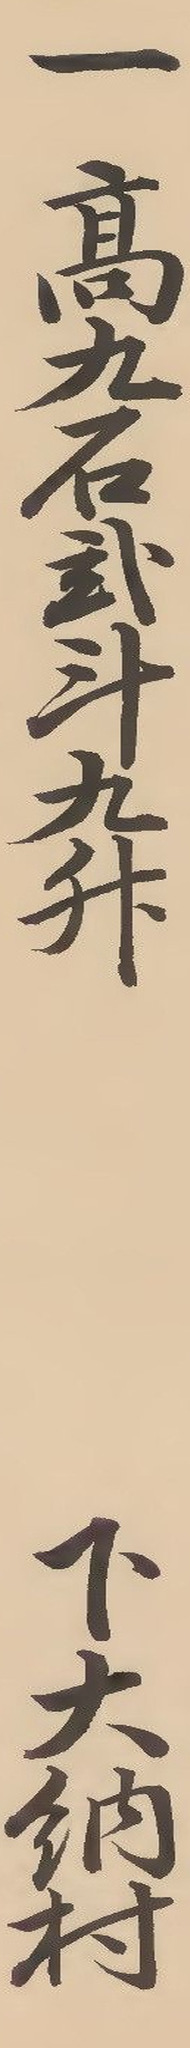一高九石弐斗九升下大納村

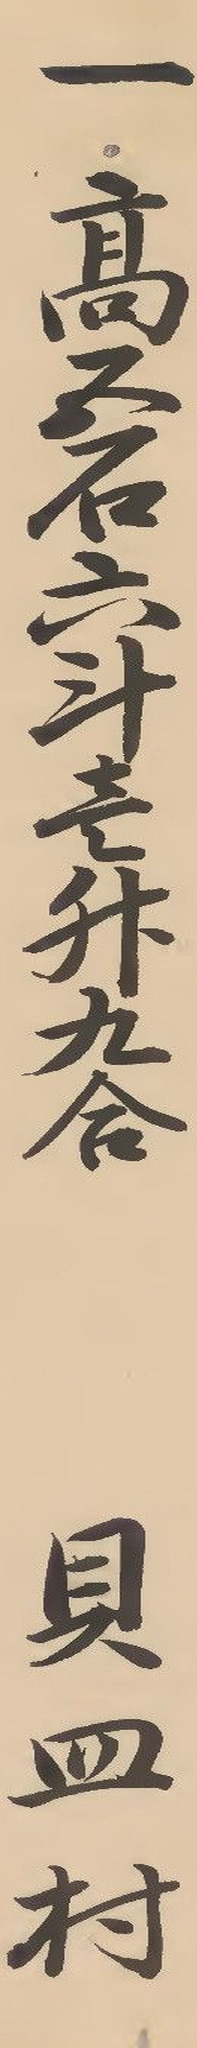一高五石六斗壱升九合貝皿村
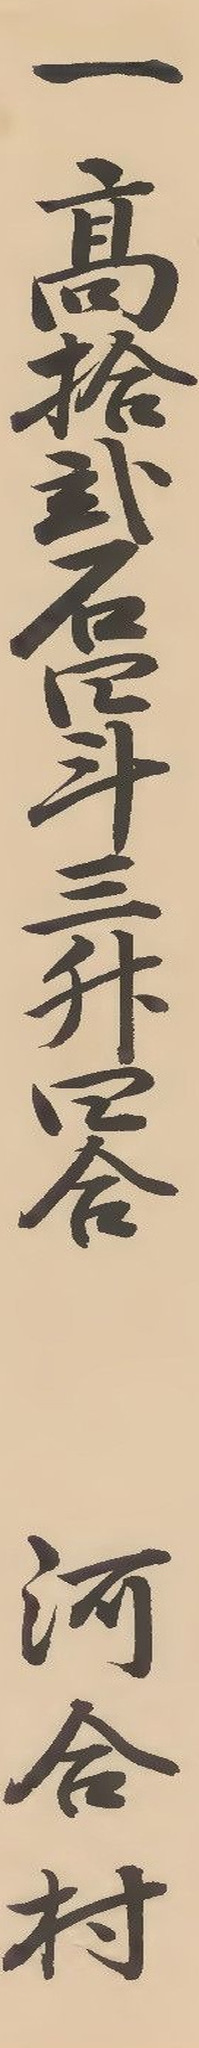一高拾弐石四斗三升四合河合村
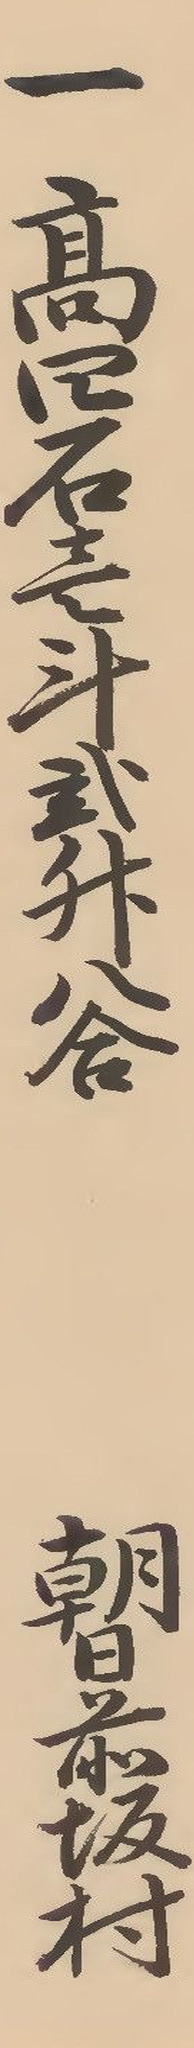一高四石壱斗弐升八合朝日前坂村
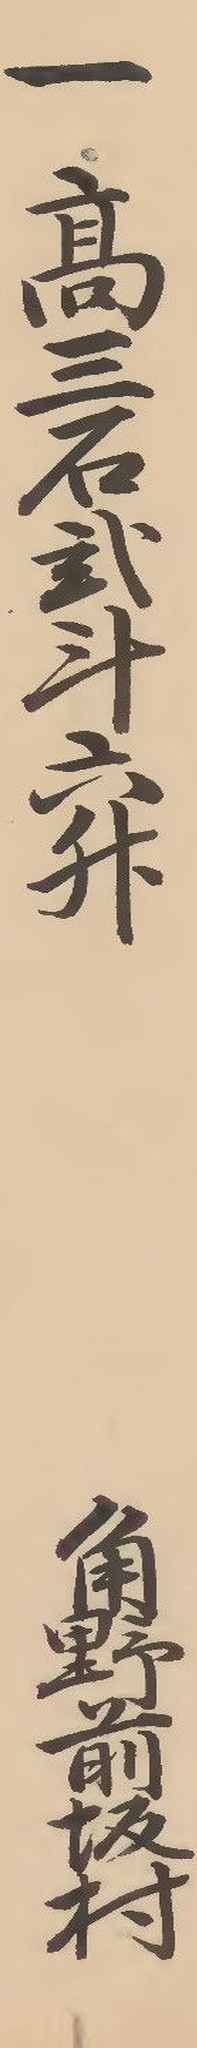一高三石弐斗六升角野前坂村

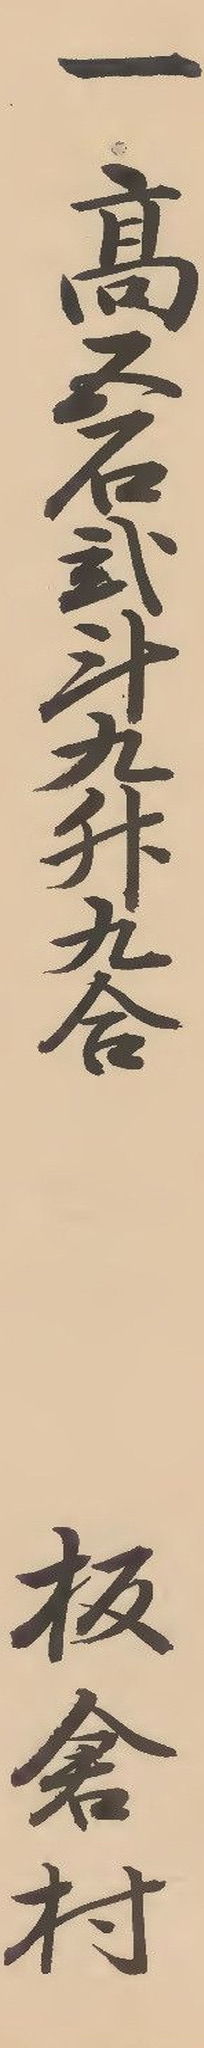一高五石弐斗九升九合板倉村
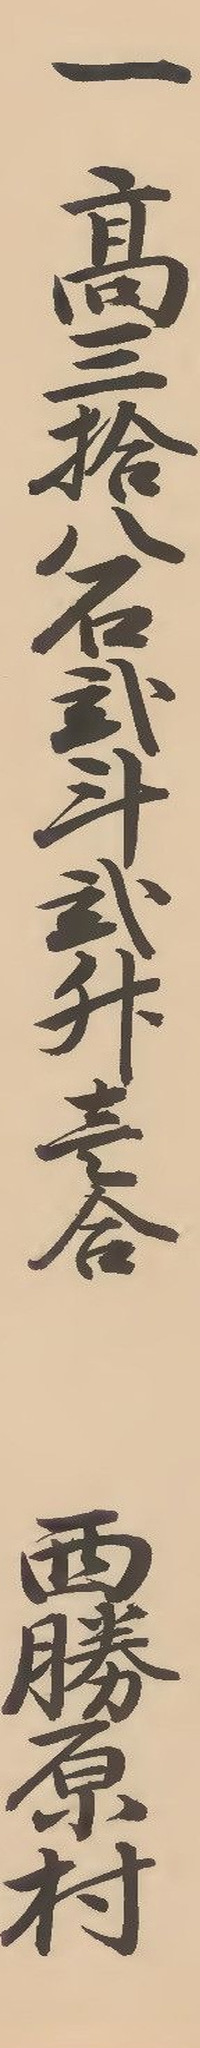一高三拾八石弐斗弐升壱合西勝原村
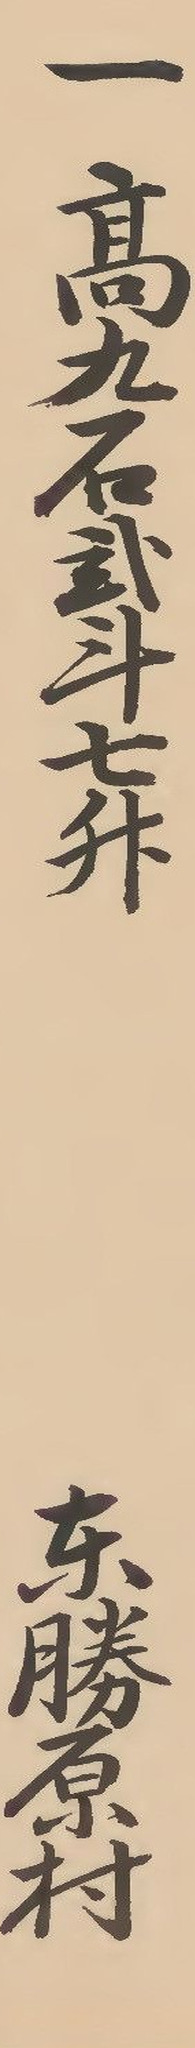一高九石弐斗七升東勝原村
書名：越前国郷帳
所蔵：国立公文書館 National Archives of Japan
